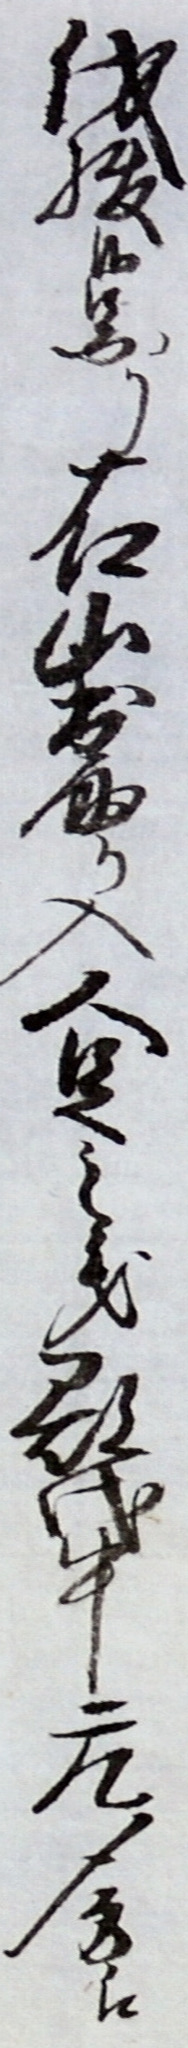伐抜候図り右山書届ヶ入人足之義郡代中元〆方江
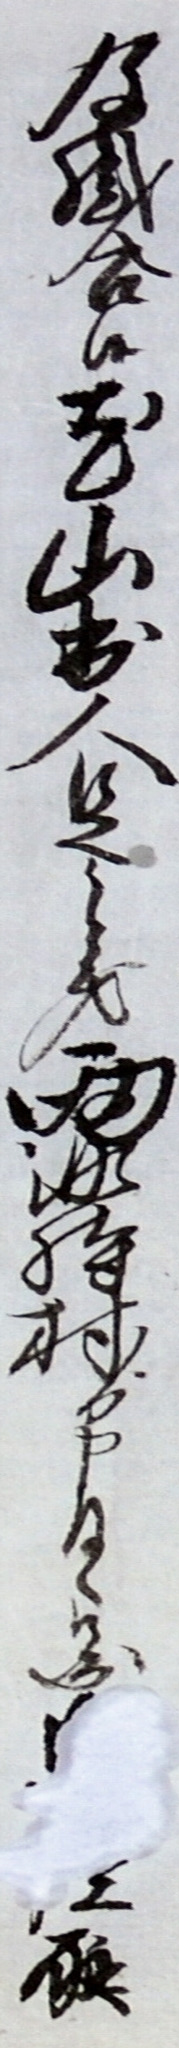及掛合候尤山出人足之義西非持村より申付候図
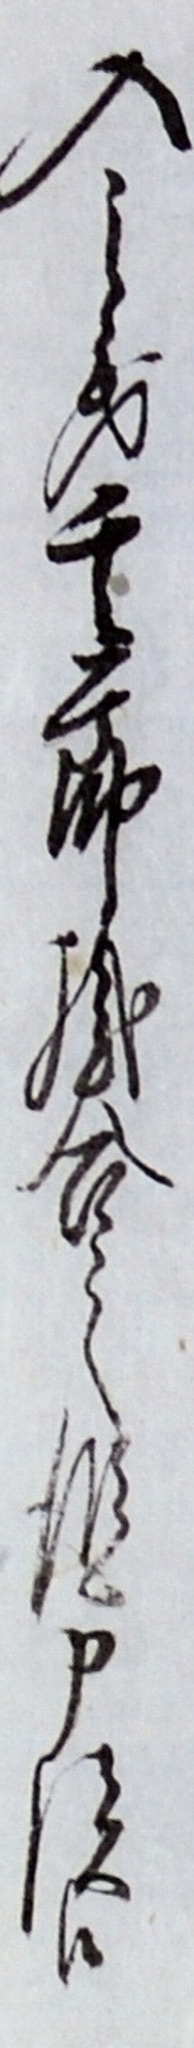入之義其節掛合之組申談候

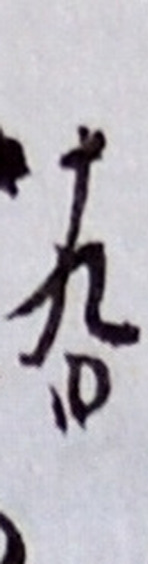十九日
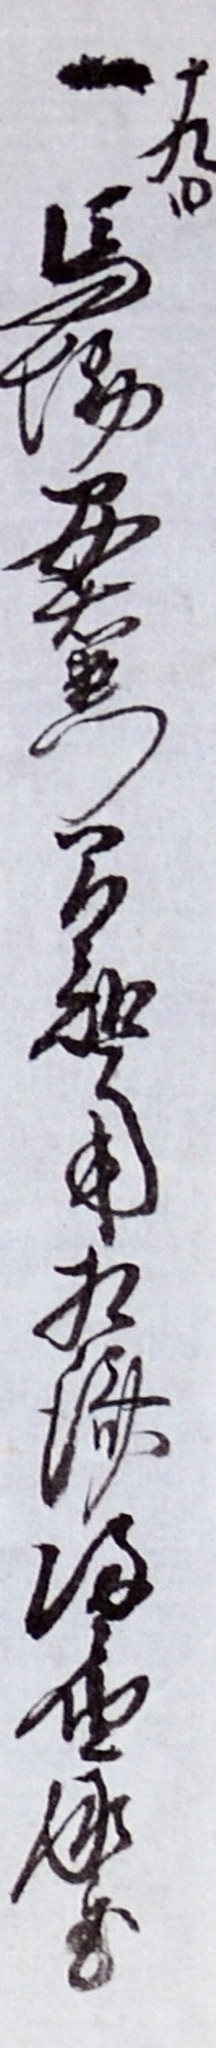一馬場安右衛門間知用相済帰届
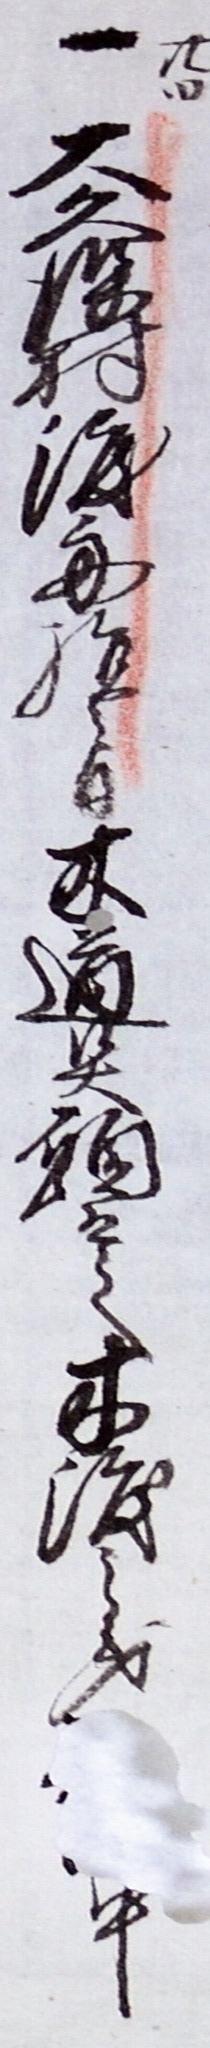一大久保村渡舟難之有木道具類有之木渡之義
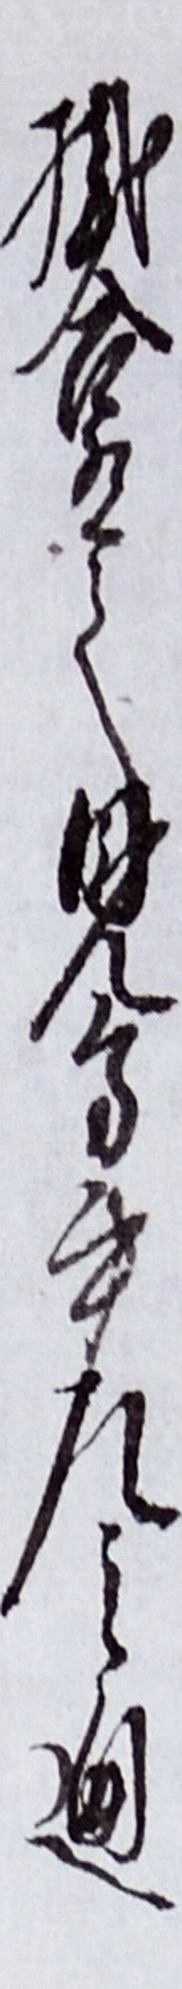掛合有之見方左之通
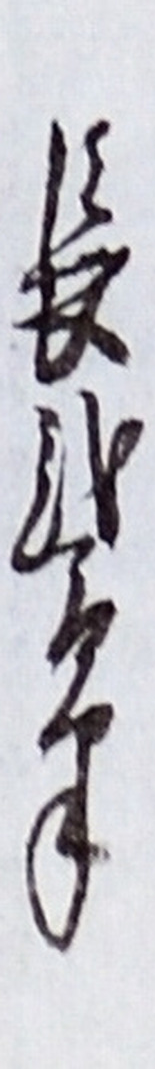長弐間半
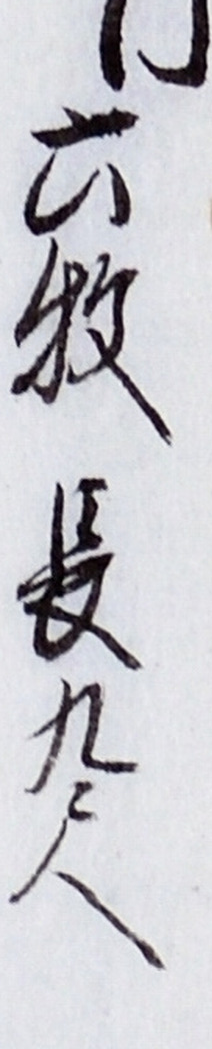六牧長九尺
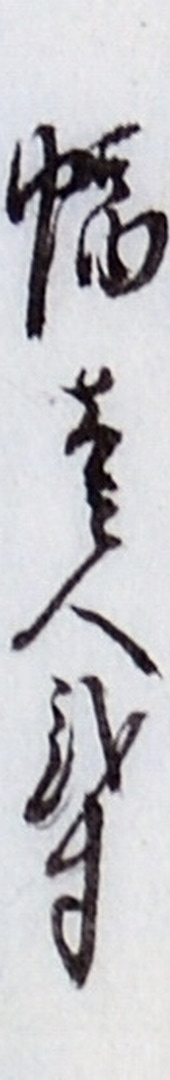幅壱人弐寸
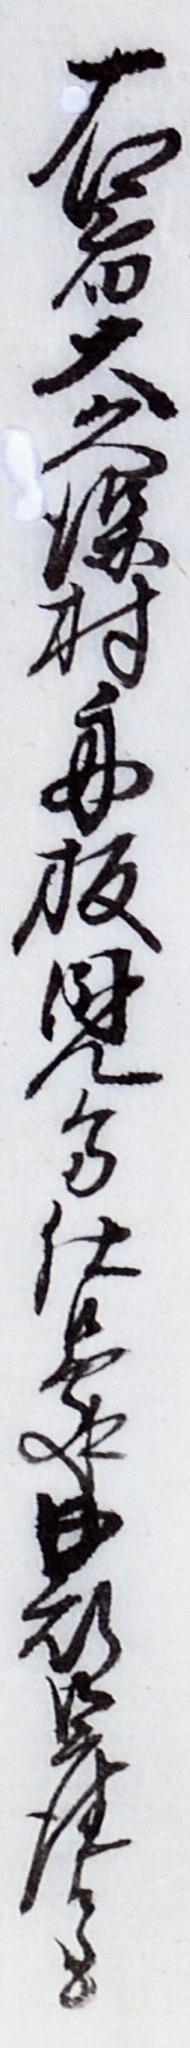一右者大久保村舟板見方仕候処御座候以上
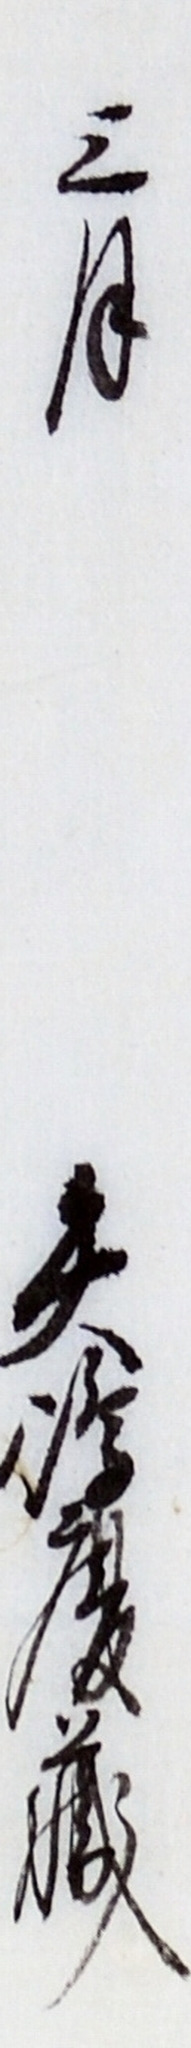三月矢嶋慶蔵
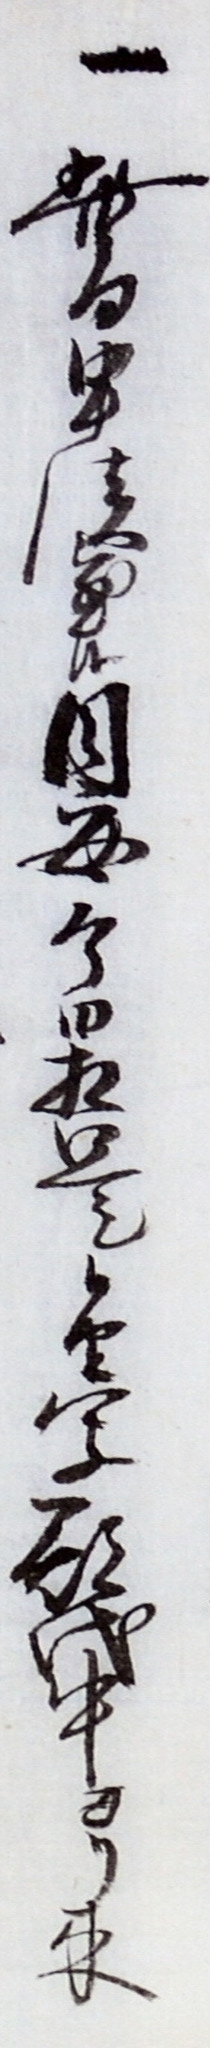一此日申談事候目安今日相廻し候処郡代中ヨリ来
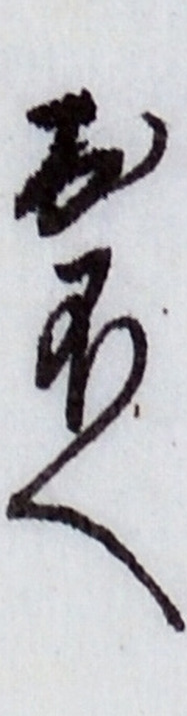おほへ
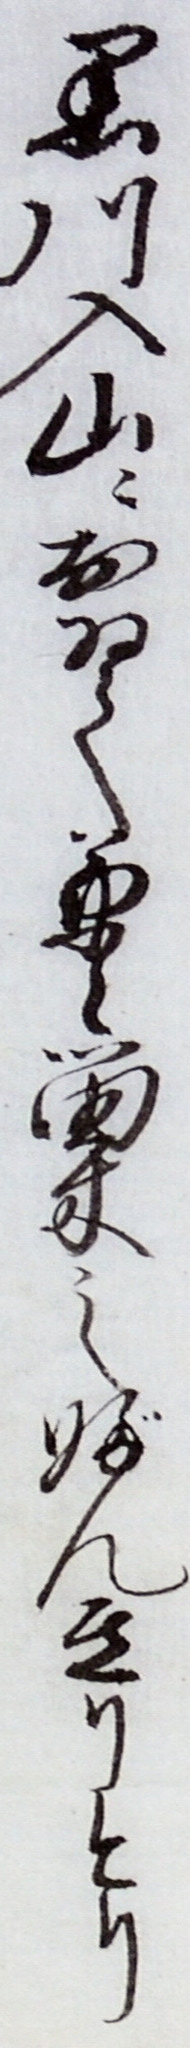黒川入山ニおゐて西々留木之ぶんきりとり
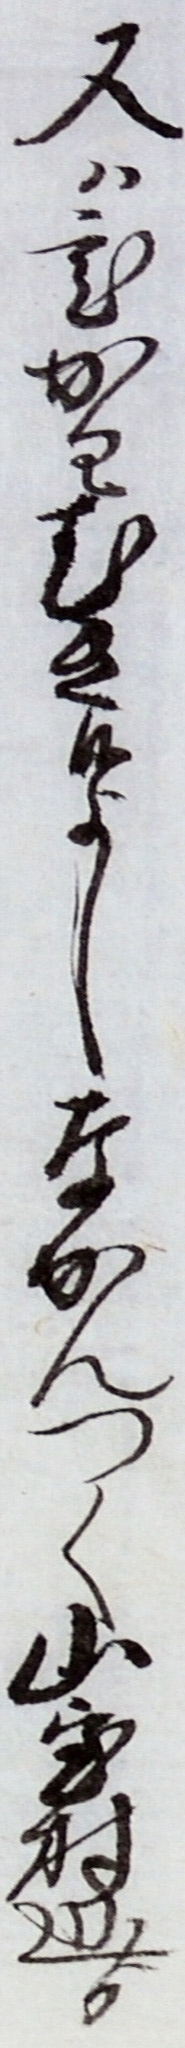又ハひかわむき候よしなかんつく山宝村辺より
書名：御山奉行御用控
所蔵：伊那市立高遠町図書館・合同会社AMANE
